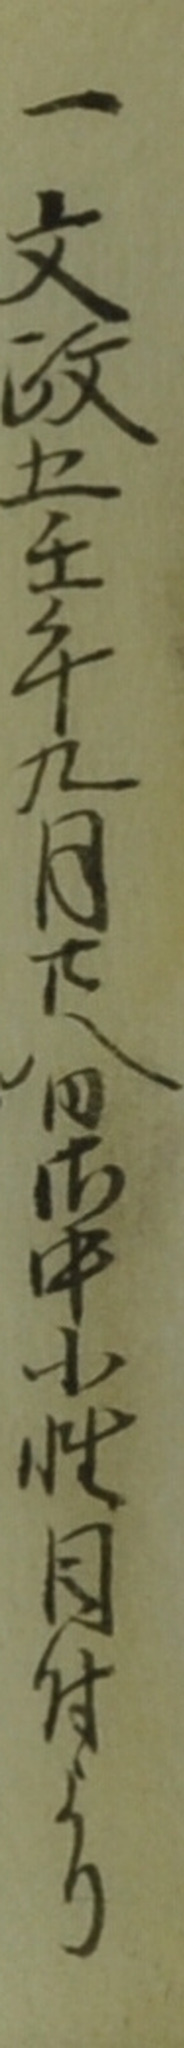一文政五壬午九月廿八日御中小性目付より
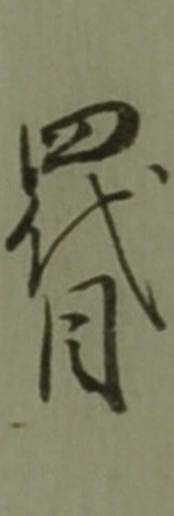四代目
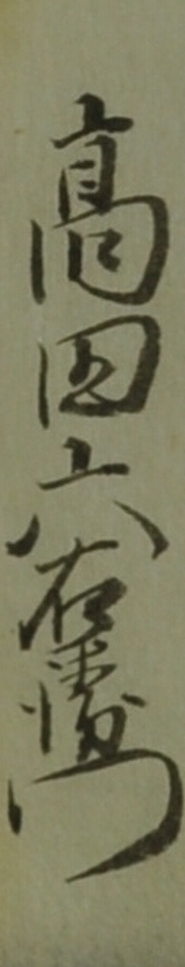高田六右衛門
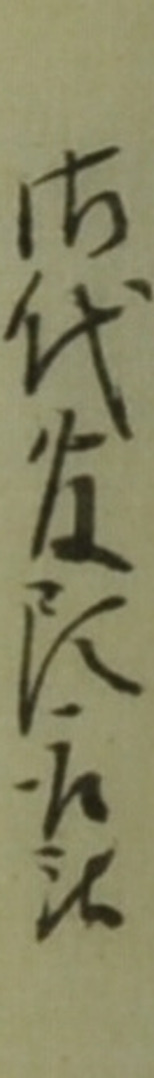御代官頭取
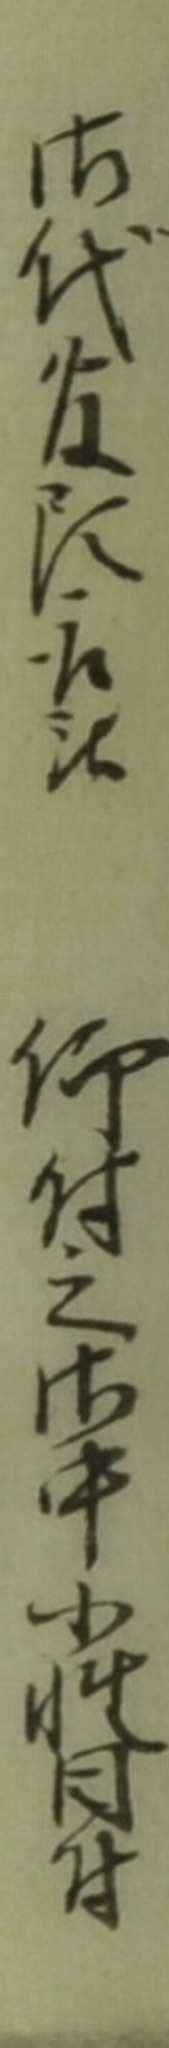御代官頭取被仰付之御中小性目付

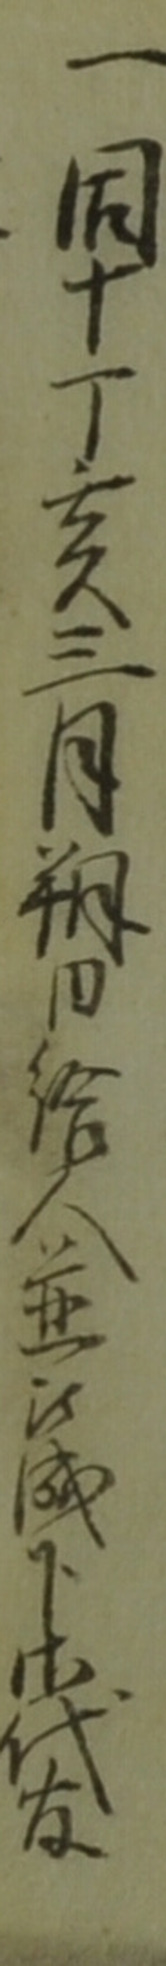一同十丁亥三月朔日給人並被成下御代官
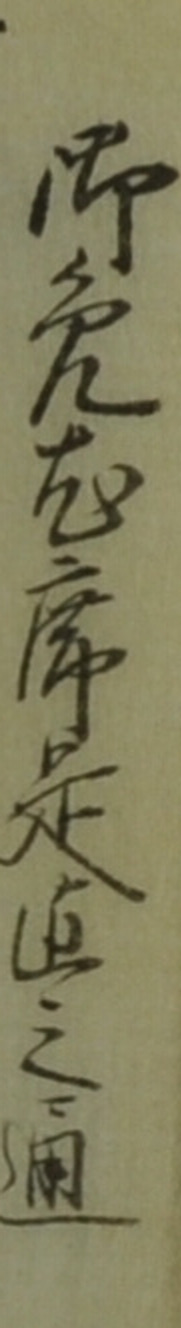御免尤席是迄之通
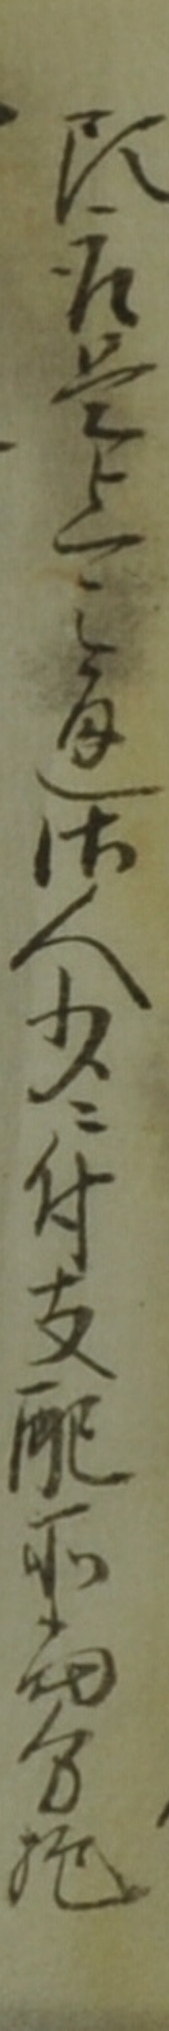頭取是迄之通御人少ニ付支配所両方抱
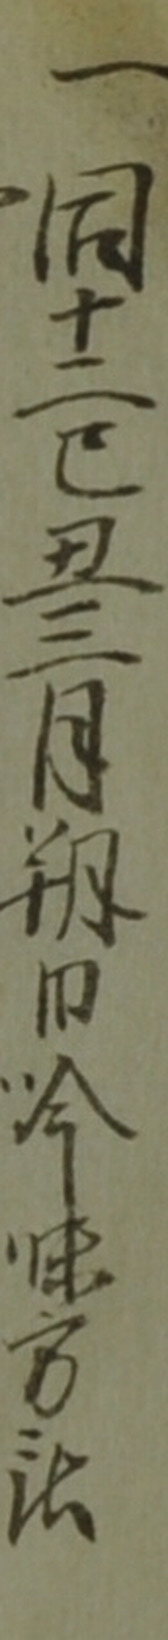一同十二己丑三月朔日吟味方被
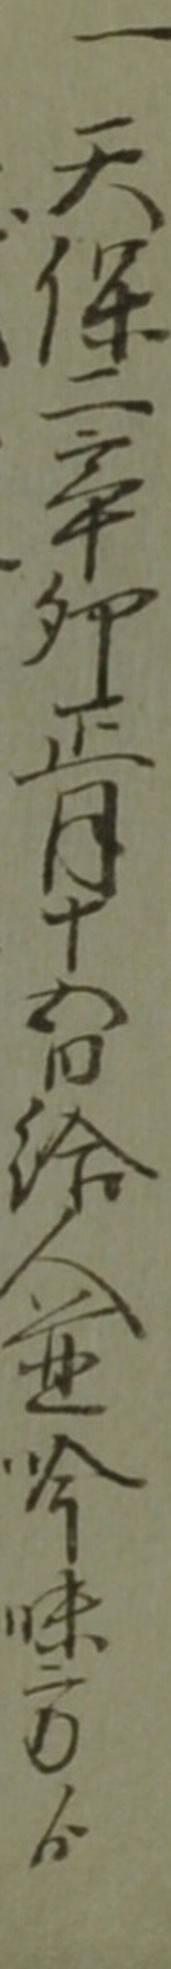一天保二辛卯正月十五日給人並吟味方より
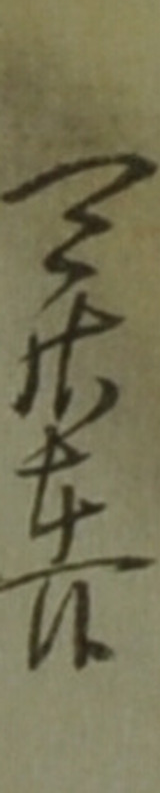可罷在候
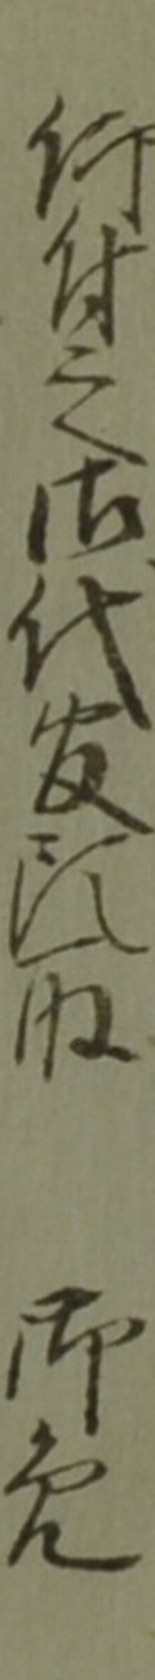仰付之御代官頭取御免
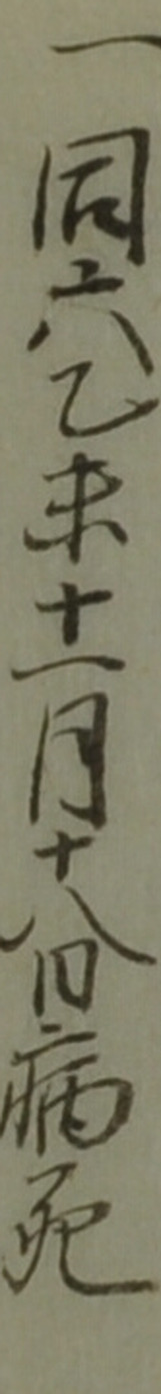一同六乙未十一月十八日病死
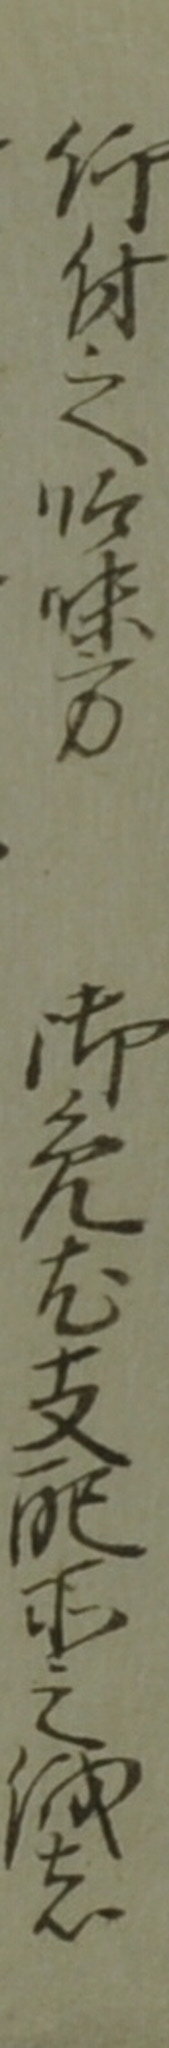仰付之吟味方御免尤支配所之儀者
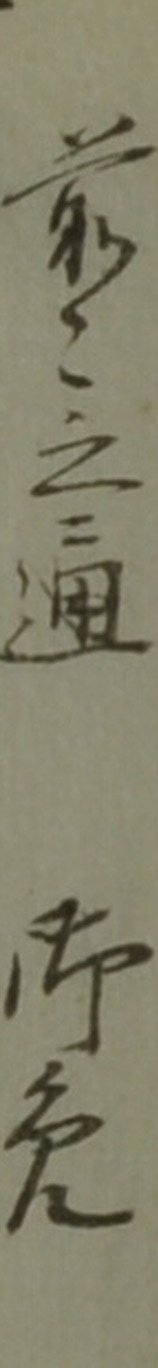前々之通御免
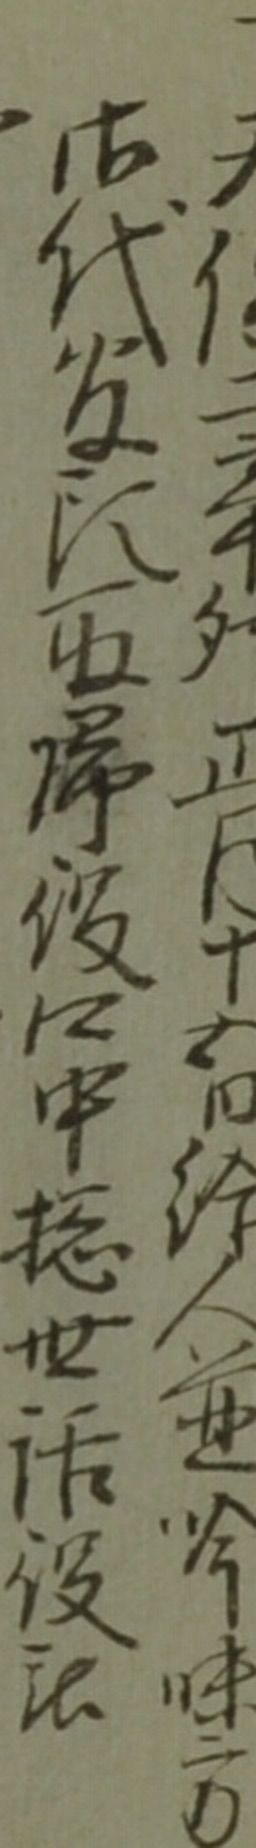御代官頭取締役郷中総世話役被
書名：諸御役代々録（八）
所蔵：伊那市立高遠町図書館・合同会社AMANE
